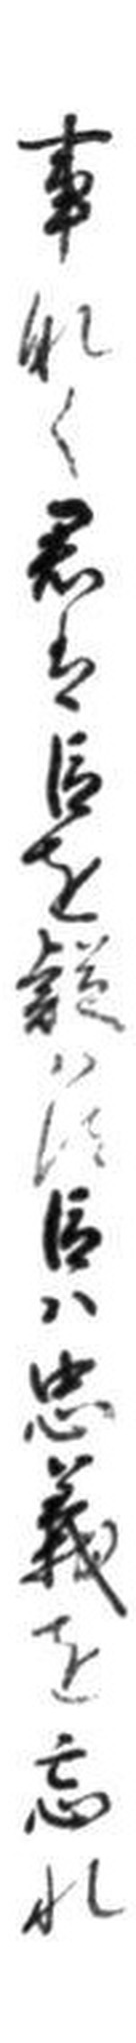事なく君は臣を疑はす臣は忠義を忘れ
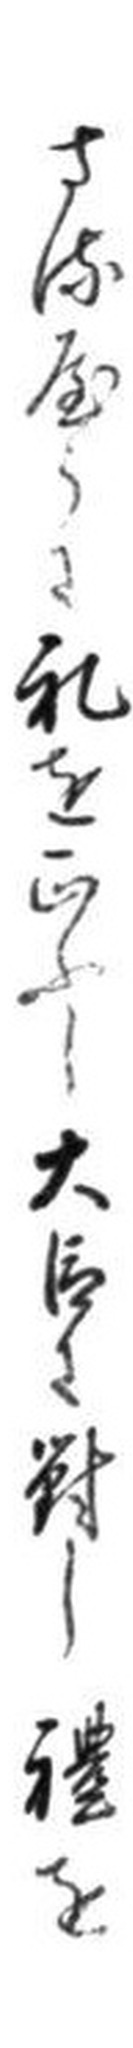さるやうに礼を正ふし大臣に対し礼を
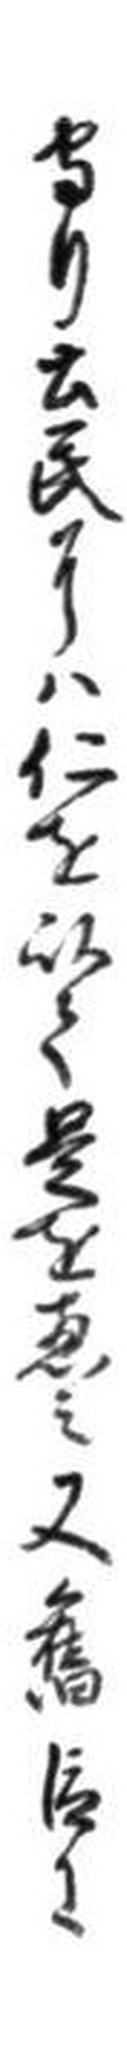守り土民には仁を以て是を恵み又旧臣に
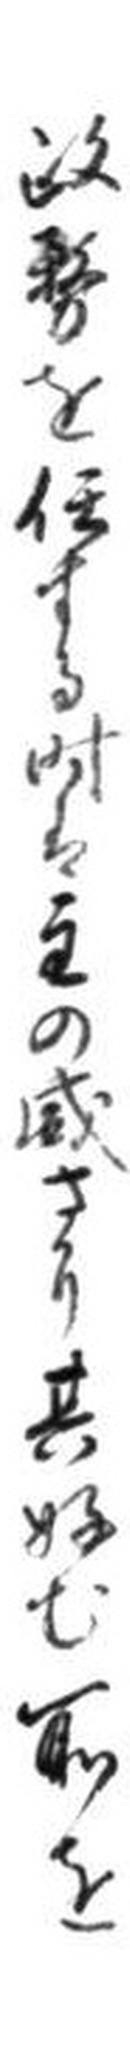政務を任する時は主の威さかり其好む所を
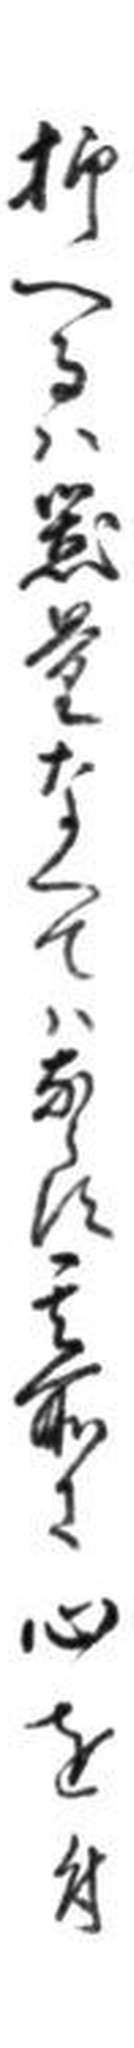抑へるは器量なくてはならす其所に心を付
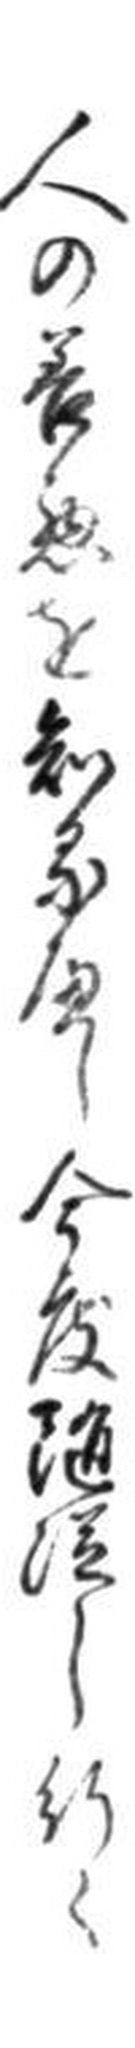人の善悪を知るへし今度随従し行く
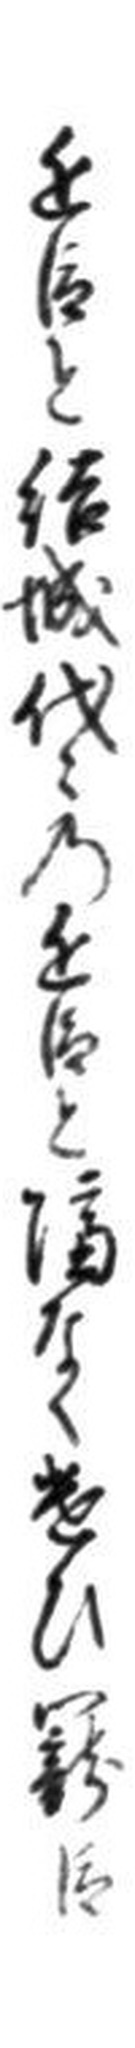近臣と結城代々の近臣と隔なく遣ひ寵臣
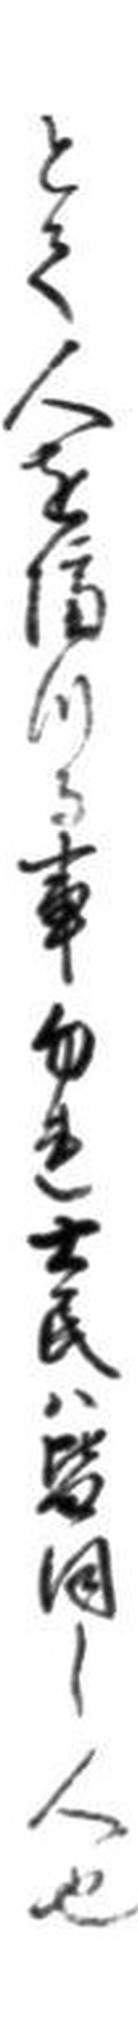とて人を隔つる事勿れ士民は皆同し人也
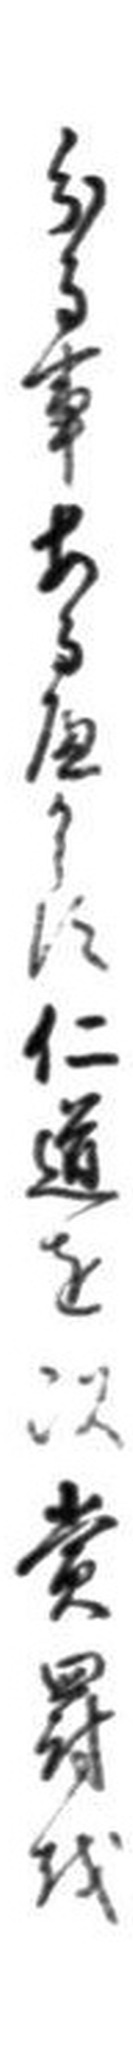分る事あるへからす仁道を以賞罰を
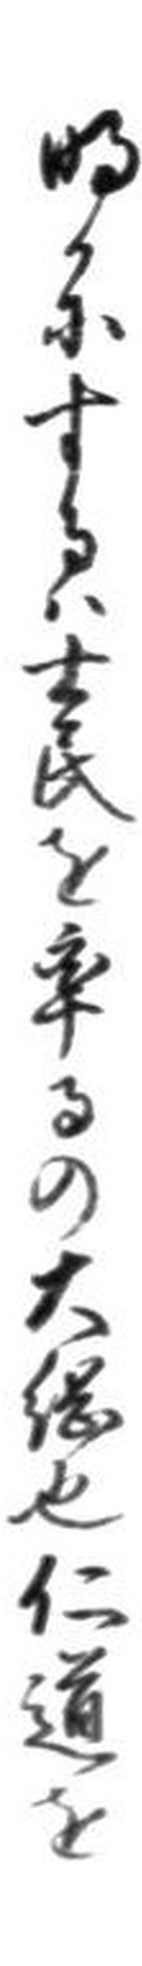明かにするは士民を率るの大綱なり仁道を
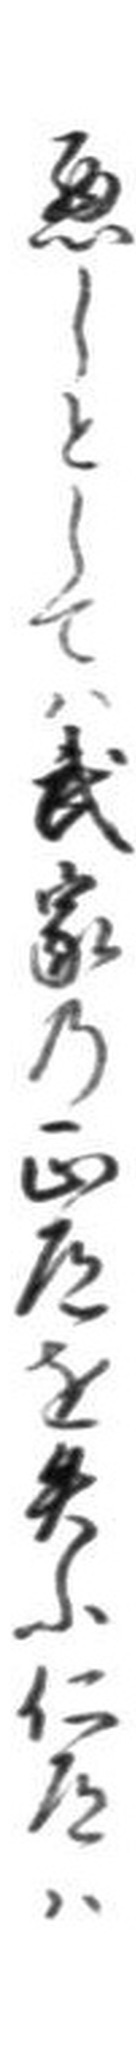悪しとしては武家の正道を失ふ仁道は
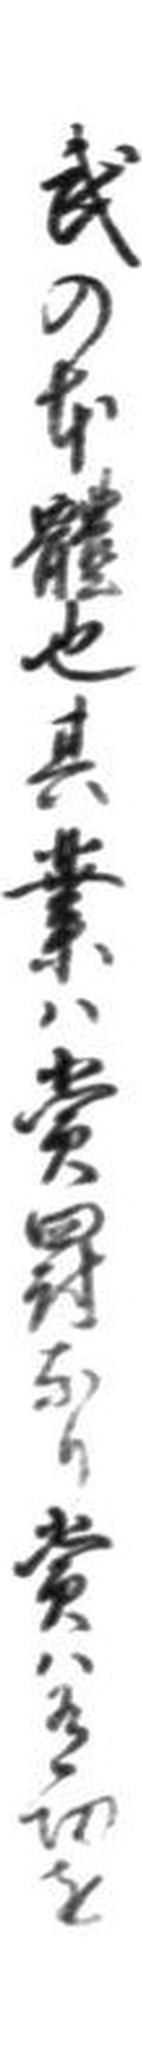武の本体也其業は賞罰なり賞は有功を
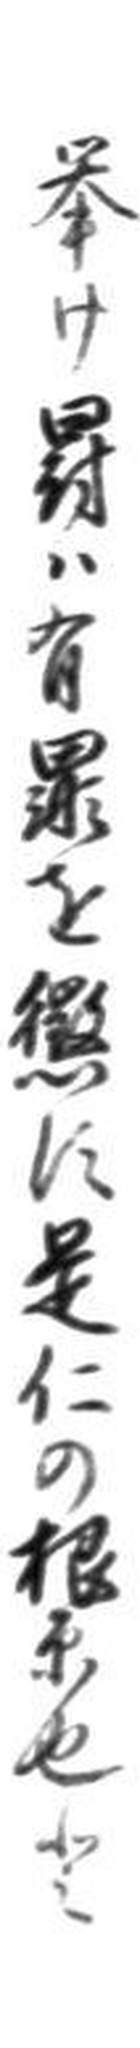挙け罰は有罪を懲す是仁の根原也と
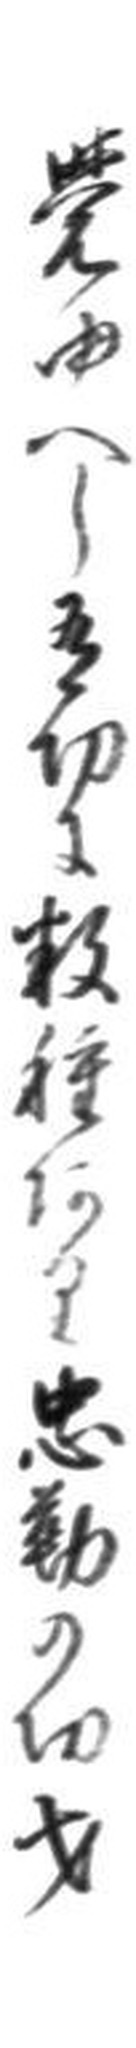覚ゆへし有功に数種あり忠勤の功才
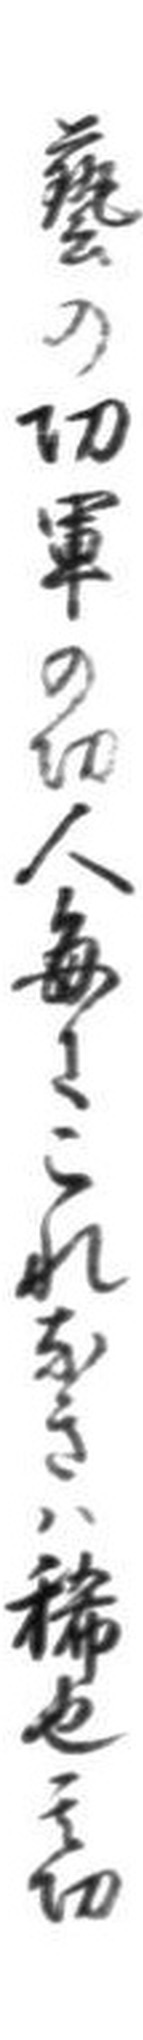芸の功軍の功人毎にこれなきは稀也其功
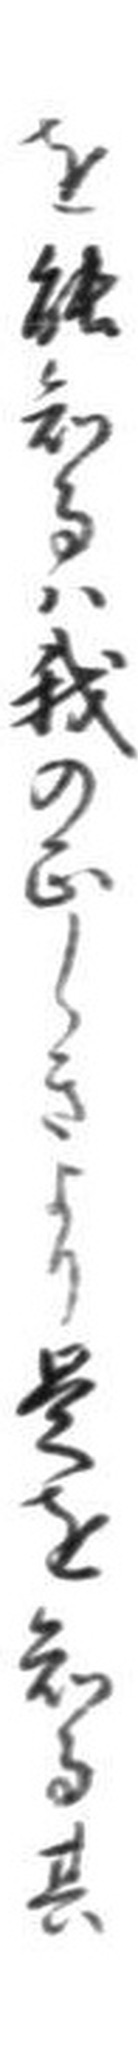を能知るは我の正しきより是を知る其
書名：家譜 一 秀康公 従天正二年到慶長十二年
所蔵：福井県文書館 Fukui Prefectural Archives
